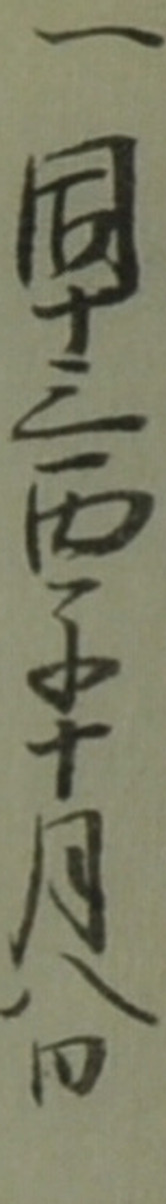一同十三丙子十月八日
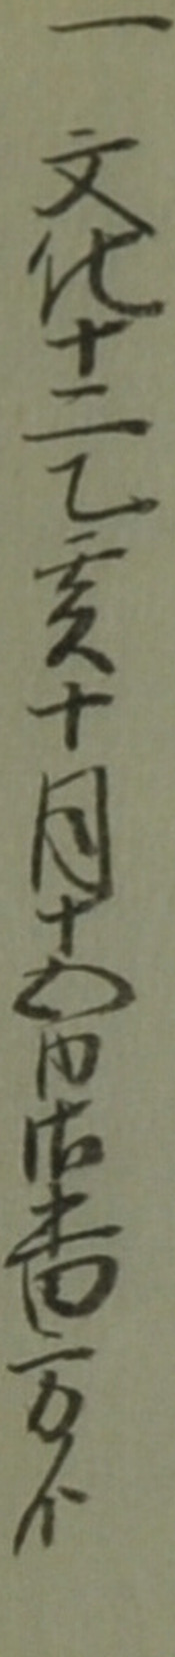一文化十二乙亥十月十五日御番方ゟ
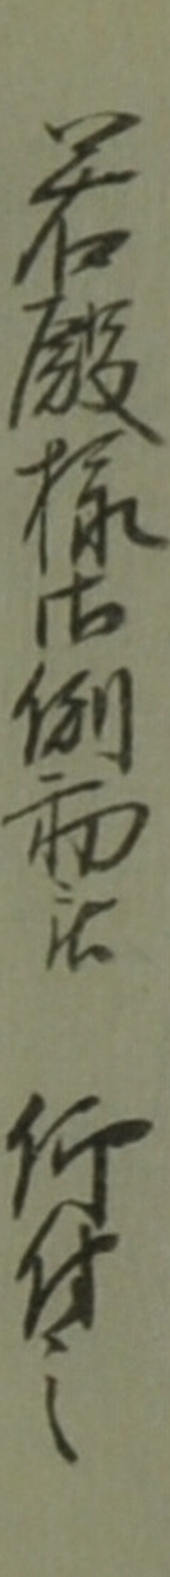若殿様御側勤被仰付之
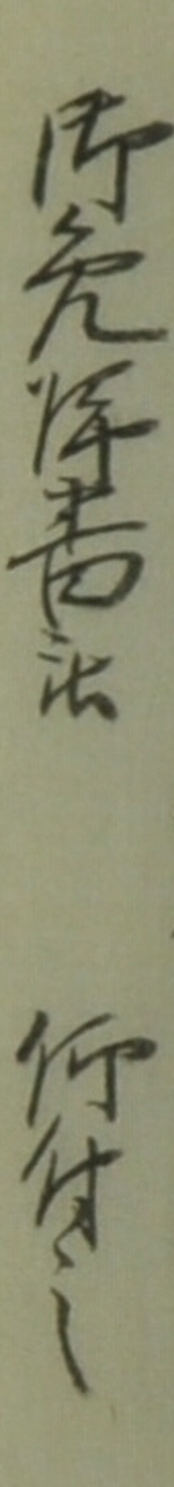御免帰番被仰付之
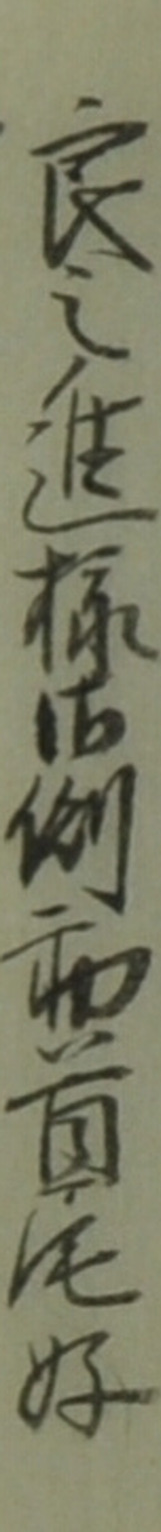良之進様御側勤首尾好
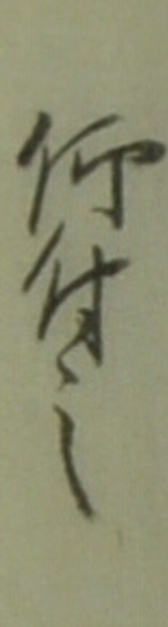仰付之

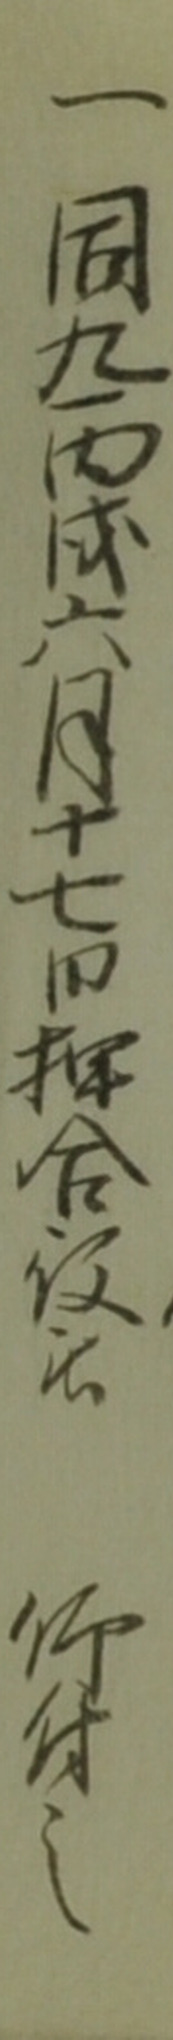一同九丙六月十七日押合役被仰付之
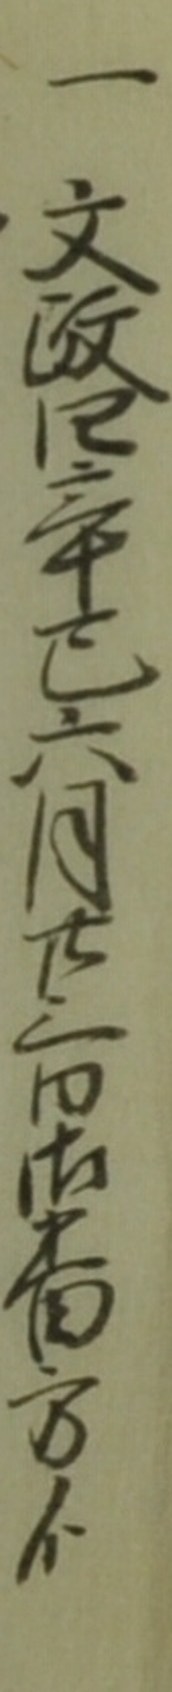一文政四辛巳六月廿三日御番方ゟ
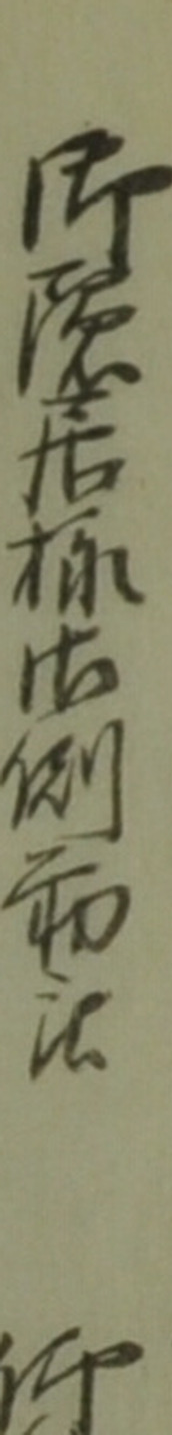御隠居様御側勤被仰付之
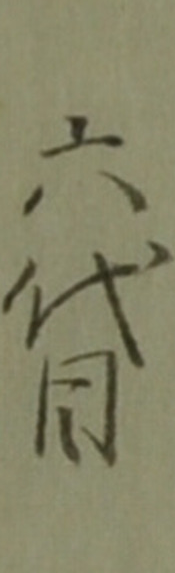六代目
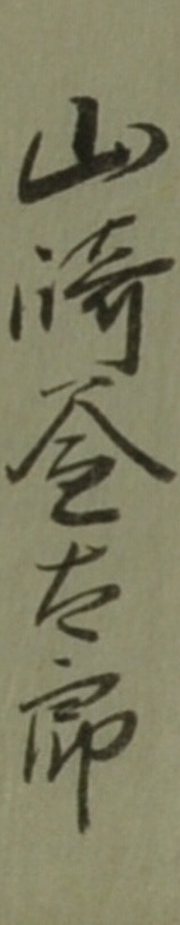山崎釜太郎
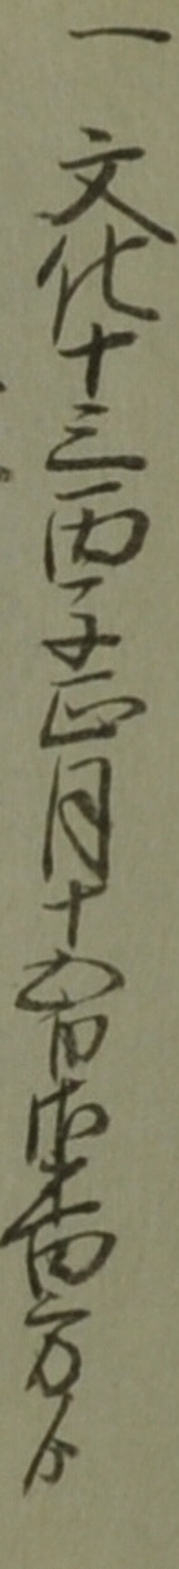一文化十三丙子正月十五日御番方ゟ
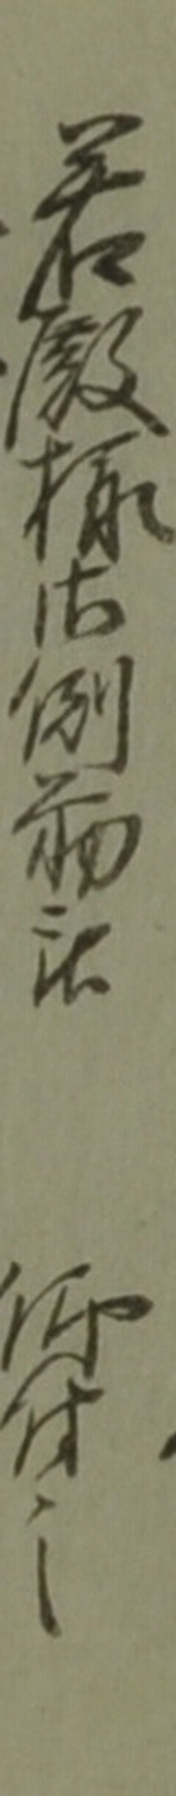若殿様御側勤被仰付之
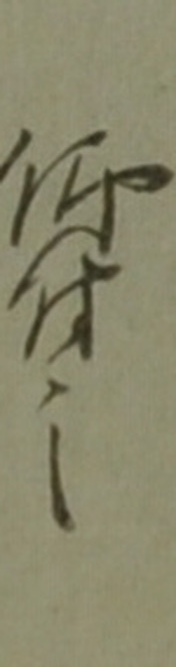仰付之
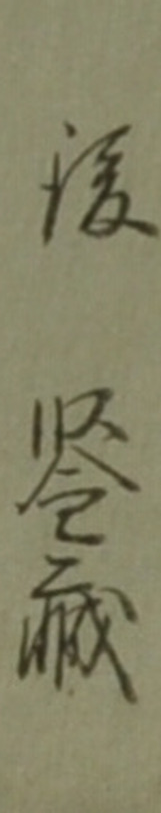後鍳蔵
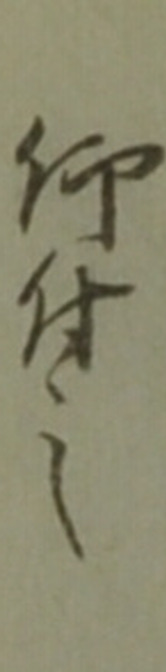仰付之
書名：諸御役代々録（五）
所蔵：伊那市立高遠町図書館・合同会社AMANE
